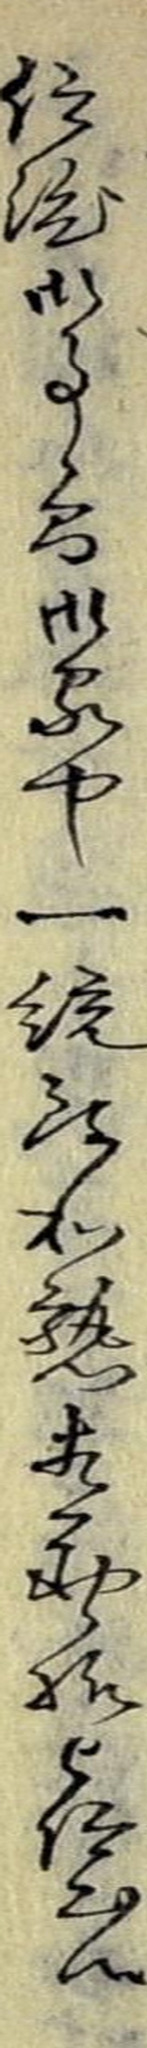仰渡御事候間御家中一統致和熟相勤候様被仰出候
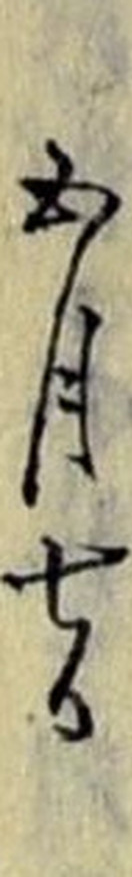五月七日
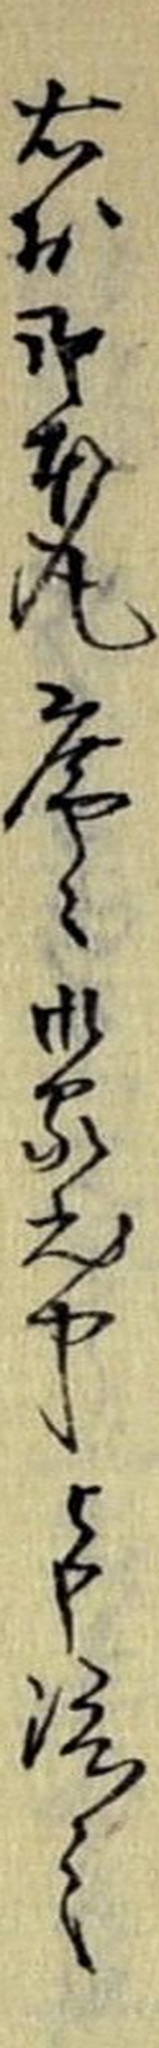右於御本丸席々御老中被申依之
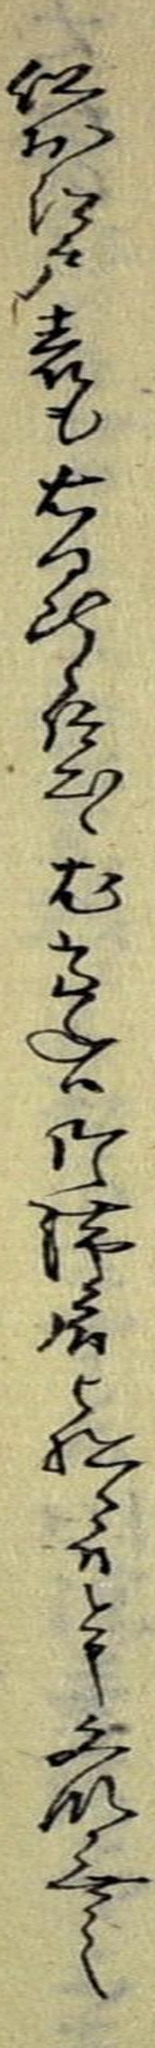但於江戸表も右同断被仰出候尤当年ハ御滞府被遊候ニ付と申文段無之
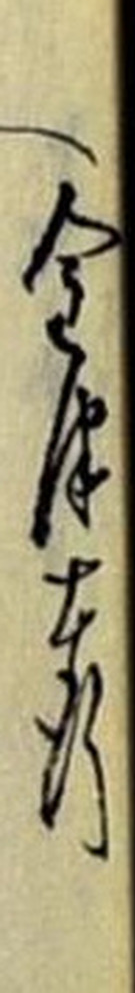金津奉行
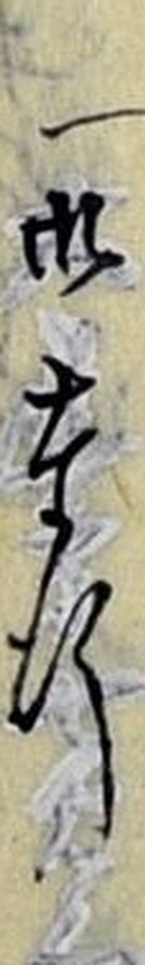御奉行
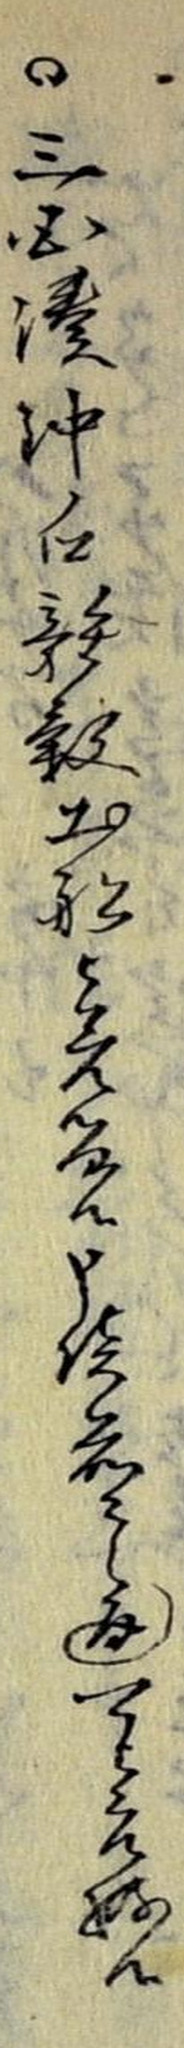○三国湊沖ノ口雑穀出船被差留候申談前々之通可被取扱候
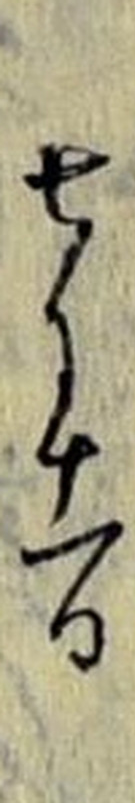七月十一日
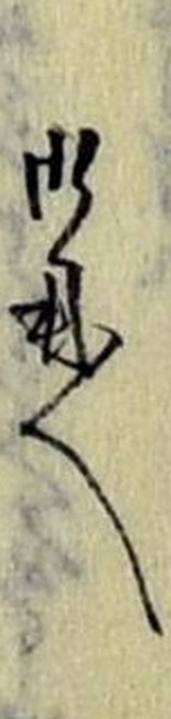御用人
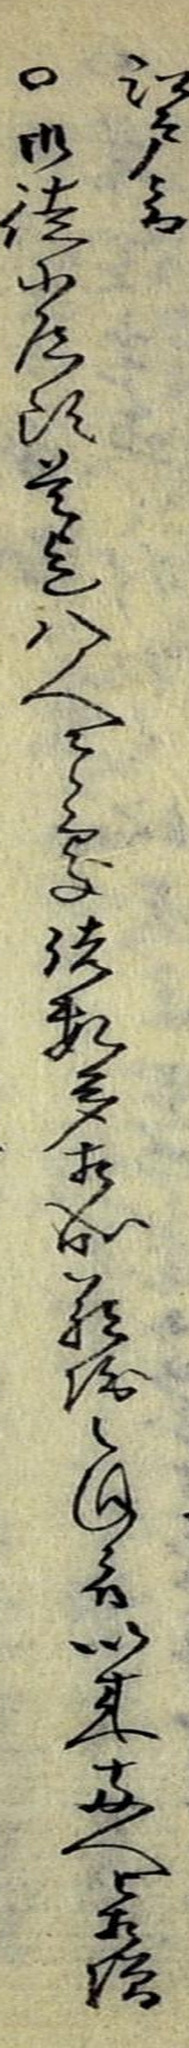○御徒小屋頭是迄八人ニ候処諸数多相成難儀之趣ニ付以来両人被相増
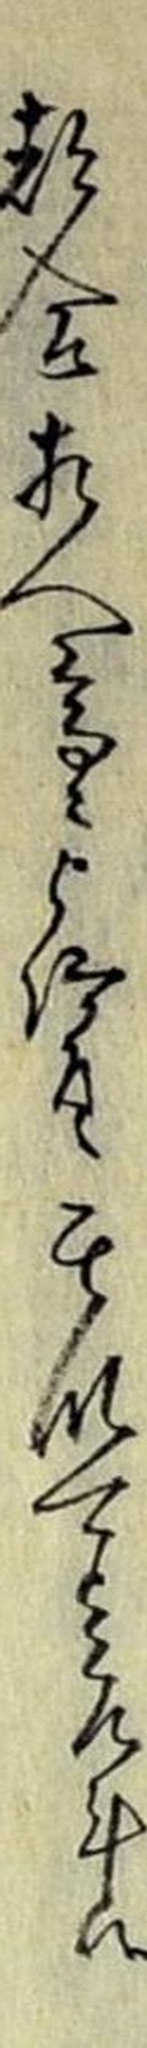都合拾人高ニ被仰付候其段可被取計候
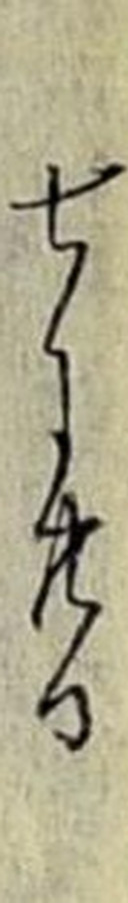七月廿日
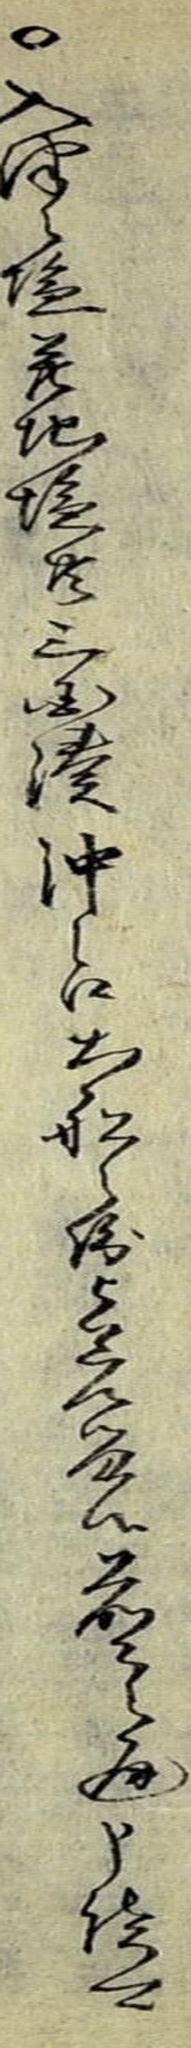○入津之塩并地塩共三国湊沖之口出船之儀被差留候前々之通申談可
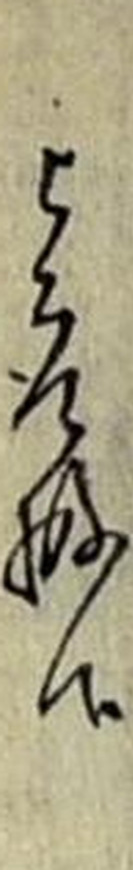被取扱候
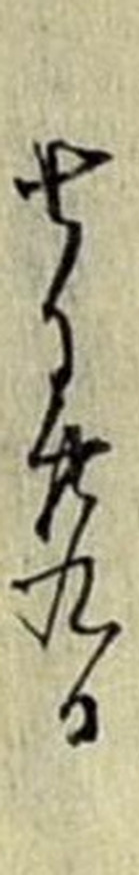七月廿九日
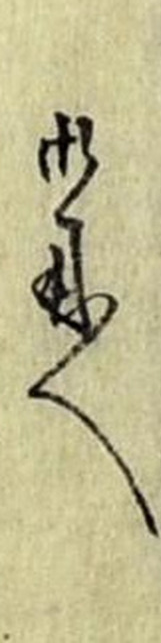御用人
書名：命令之部 五
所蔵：福井県文書館 Fukui Prefectural Archives
